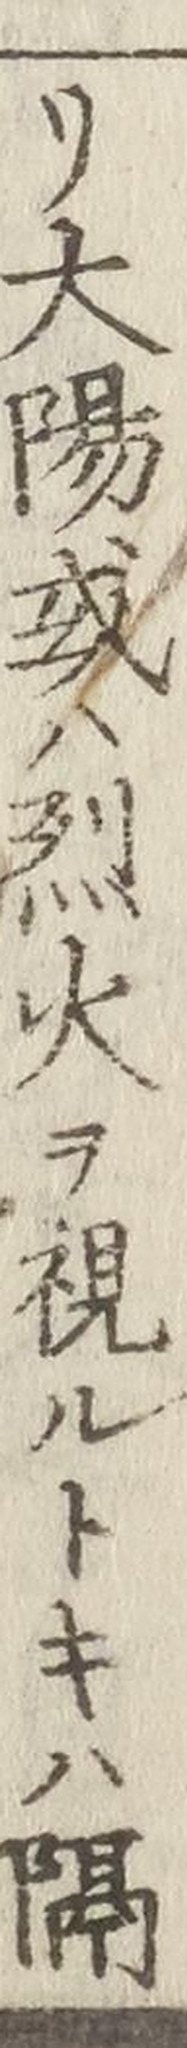リ太陽或ハ烈火ヲ視ルトキハ隔
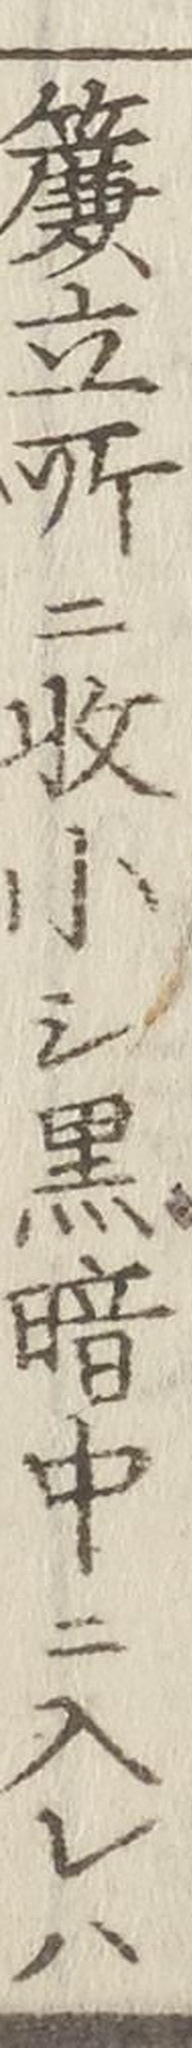簾立所ニ収小シ黒暗中ニ入レハ
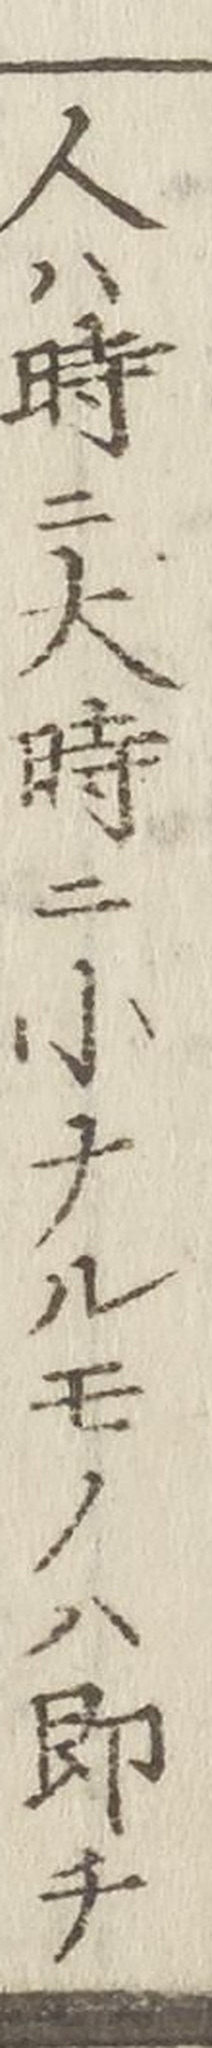人ハ時ニ大時ニ小ナルモノハ即チ
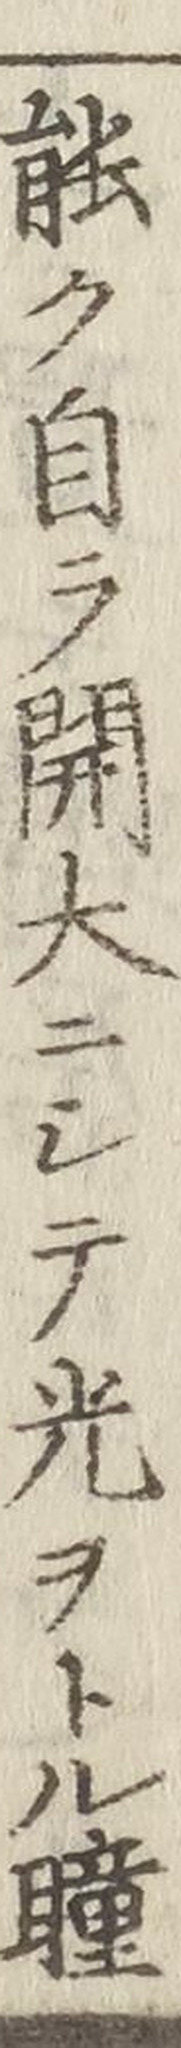能ク自ラ開大ニシテ光ヲトル瞳
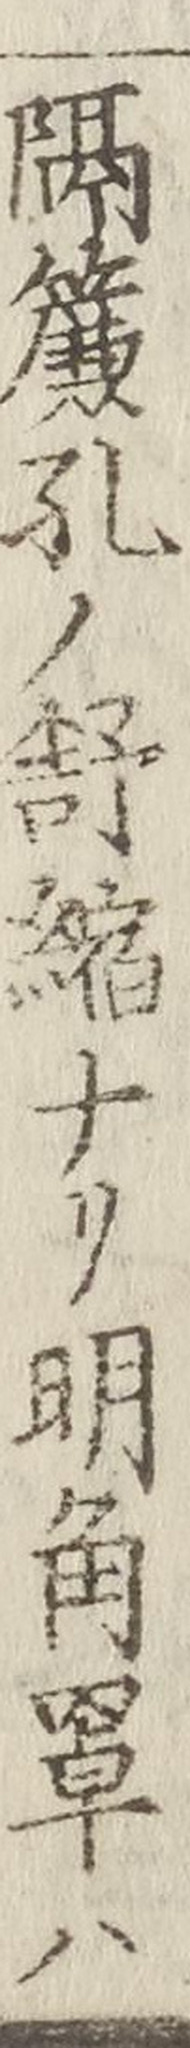隔簾孔ノ舒縮ナリ明角罩ハ
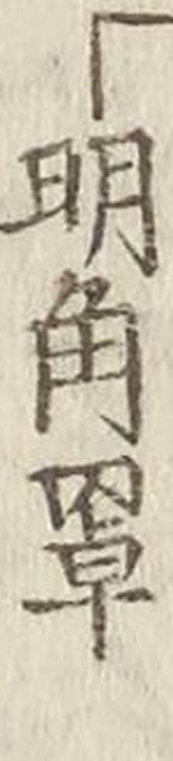明角罩
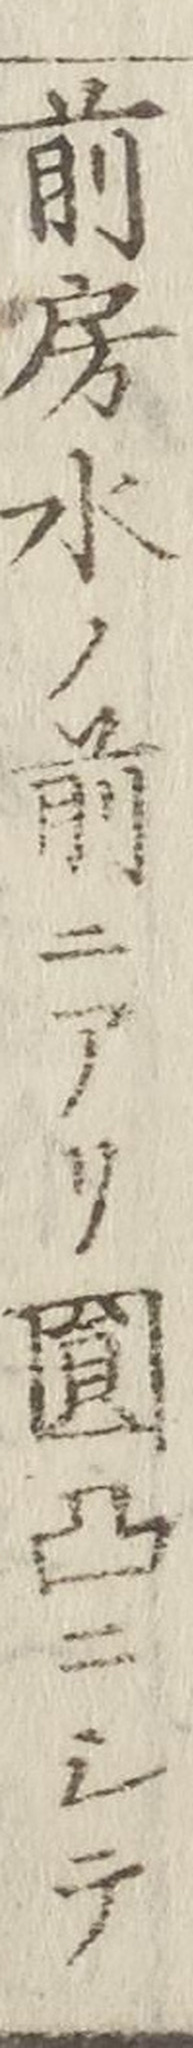前房水ノ前ニアリ円凸ニシテ
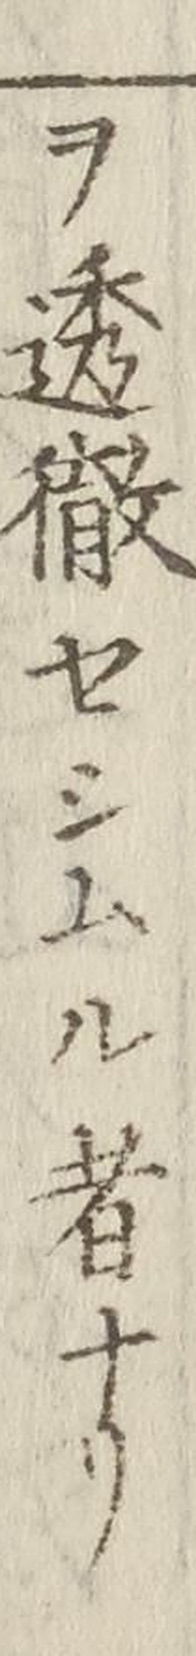ヲ透徹セシムル者ナリ
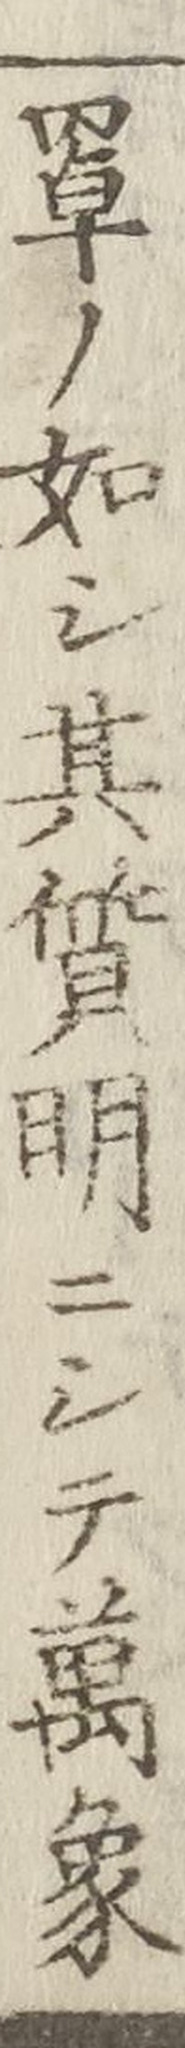罩ノ如シ其質明ニシテ万象

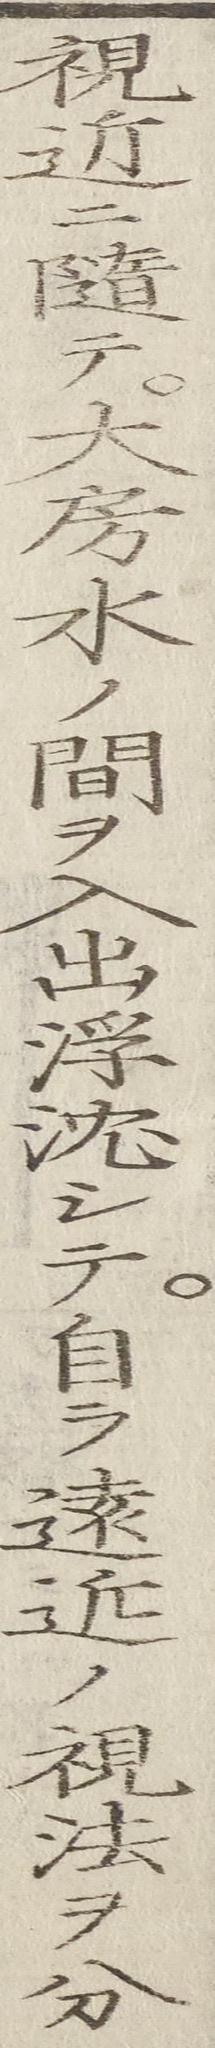視近ニ随テ。大房水ノ間ヲ入出浮沈シテ。自ラ遠近ノ視法ヲ分
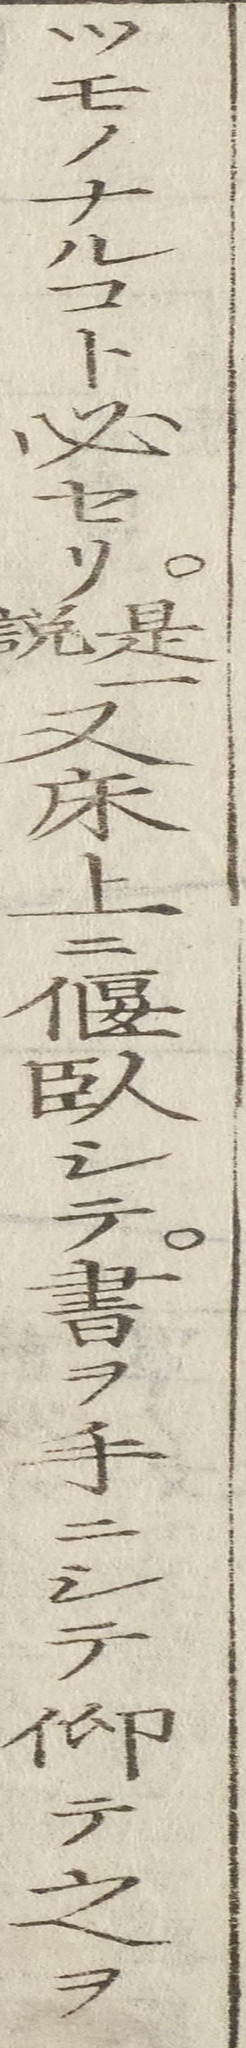ツモノナルコト必セリ。是一説又床上ニ偃臥シテ。書ヲ手ニシテ仰テ之ヲ
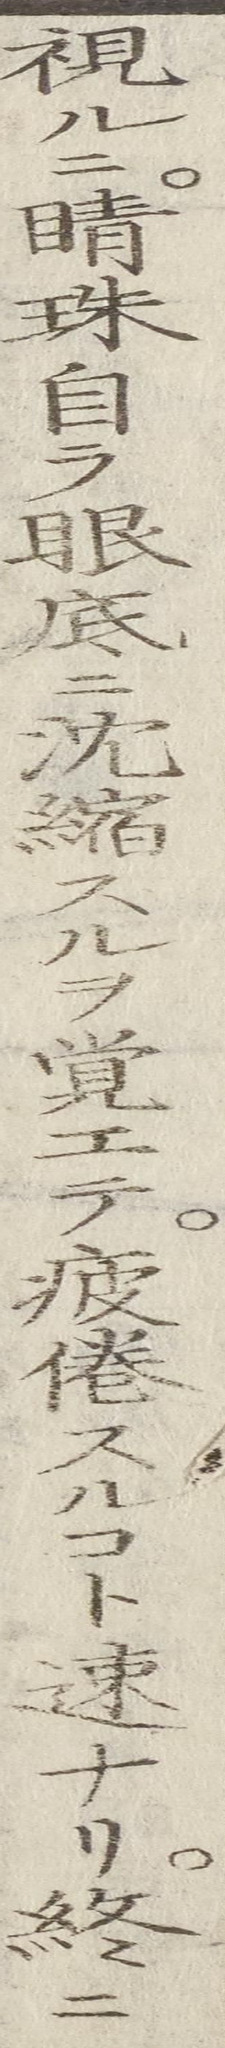視ルニ。睛珠自ラ眼底ニ沈縮スルヲ覚エテ。疲倦スルコト速ナリ。終ニ
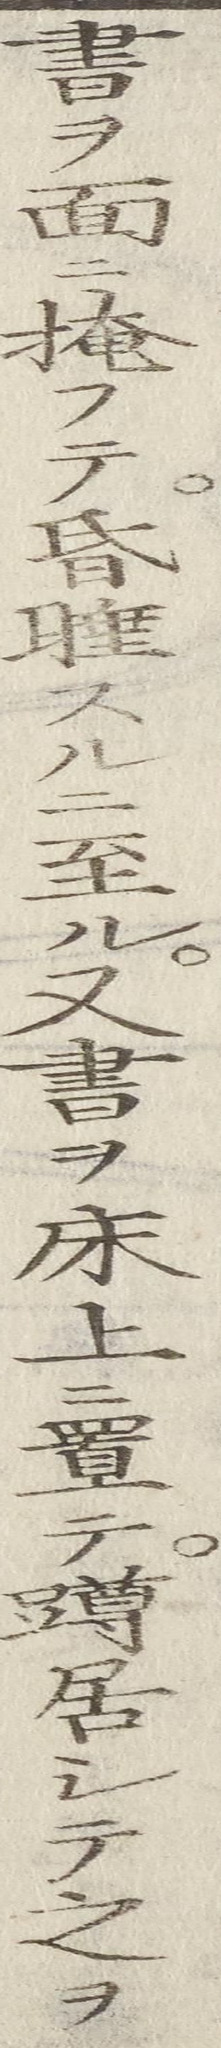書ヲ面ニ倦フテ。昏睡スルニ至ル。又書ヲ床上ニ置テ。蹲居シテ之ヲ
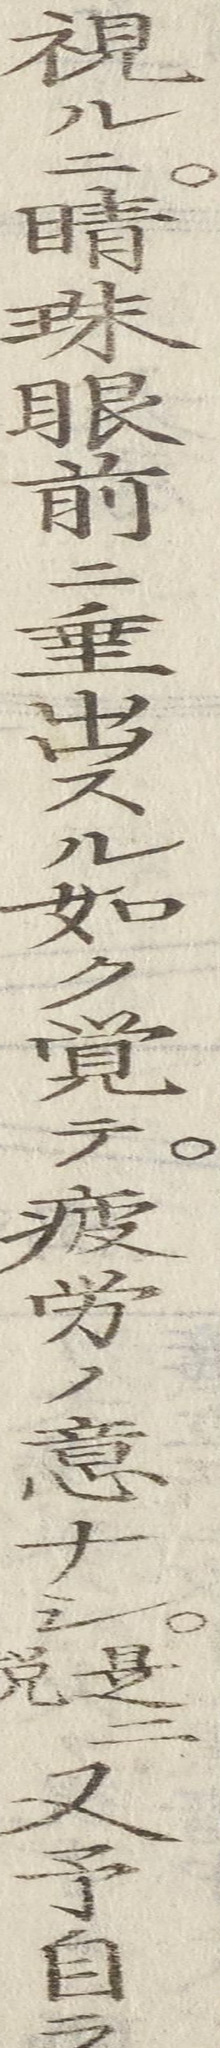視ルニ。睛珠眼前ニ垂出スル如ク覚テ。疲労ノ意ナシ。是ニ説又予自ラ
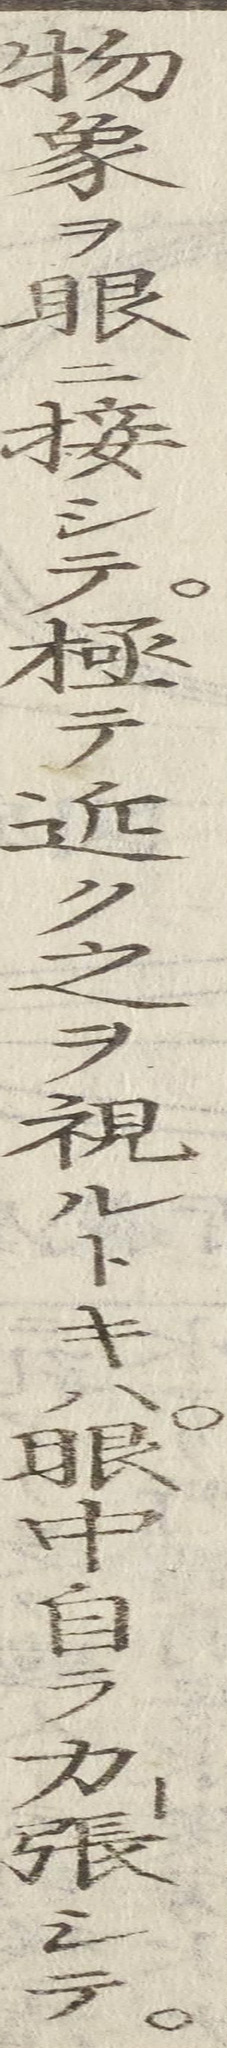物象ヲ眼ニ接シテ。極テ近ク之ヲ視ルトキハ。眼中自ラ力張シテ。
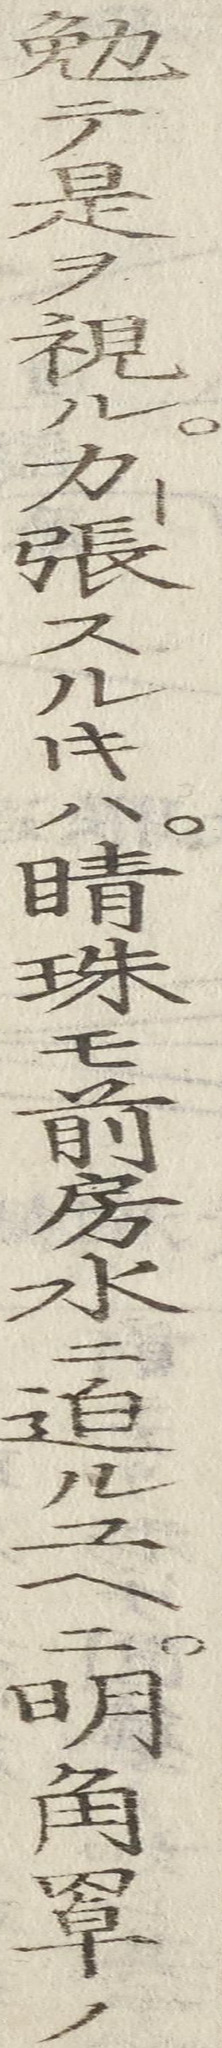勉テ是ヲ視ル。力張スルトキハ。睛珠モ前房水ニ迫ルユヘニ。明角罩ノ
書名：護法新論　二編　下
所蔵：東京大学地震研究所図書室 Earthquake Research Institute Library, The University of Tokyo, JAPAN
